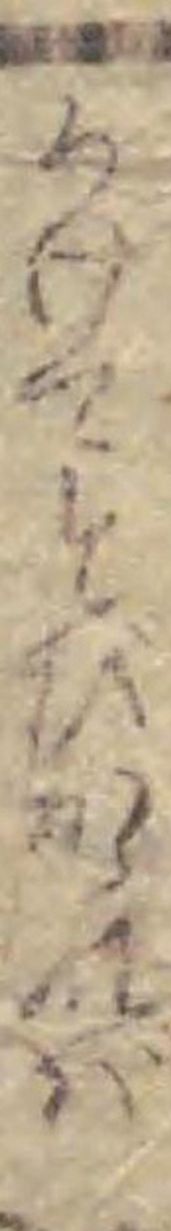かけてとびかゝれば
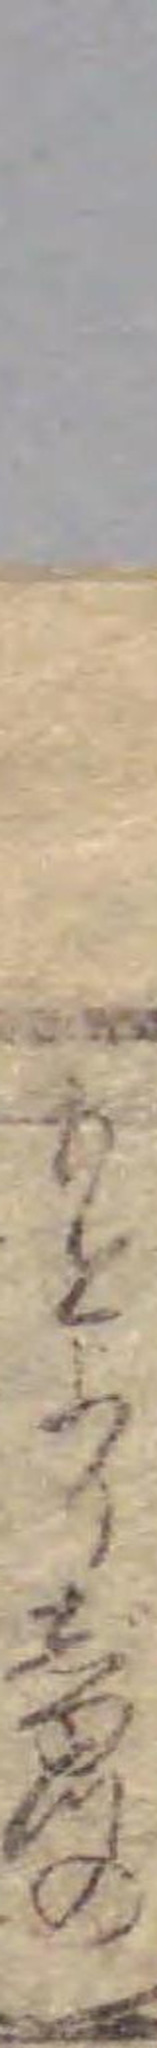もとよりじゆつの
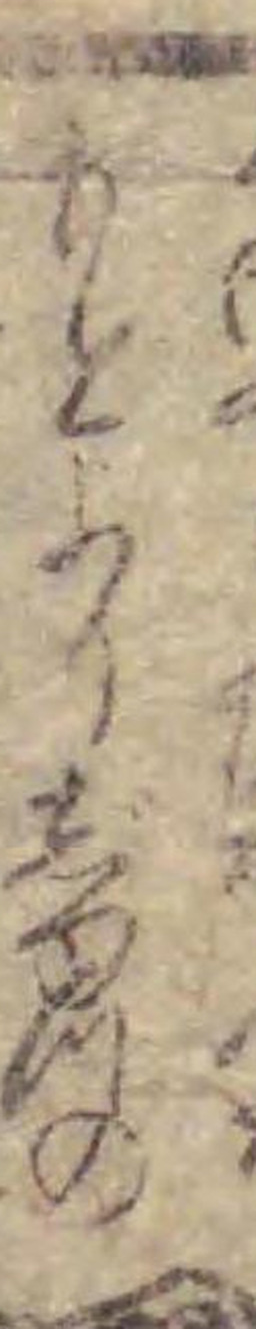もとよりじゆつの
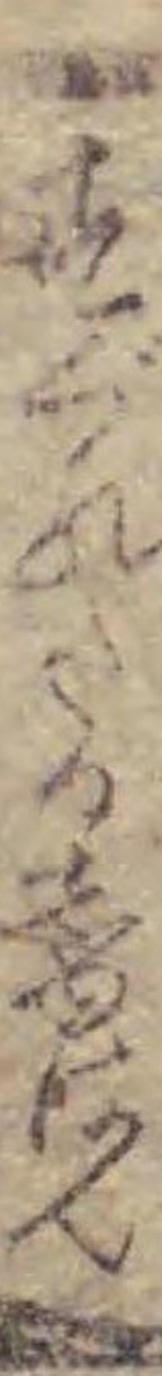すぐれたるしゆはん
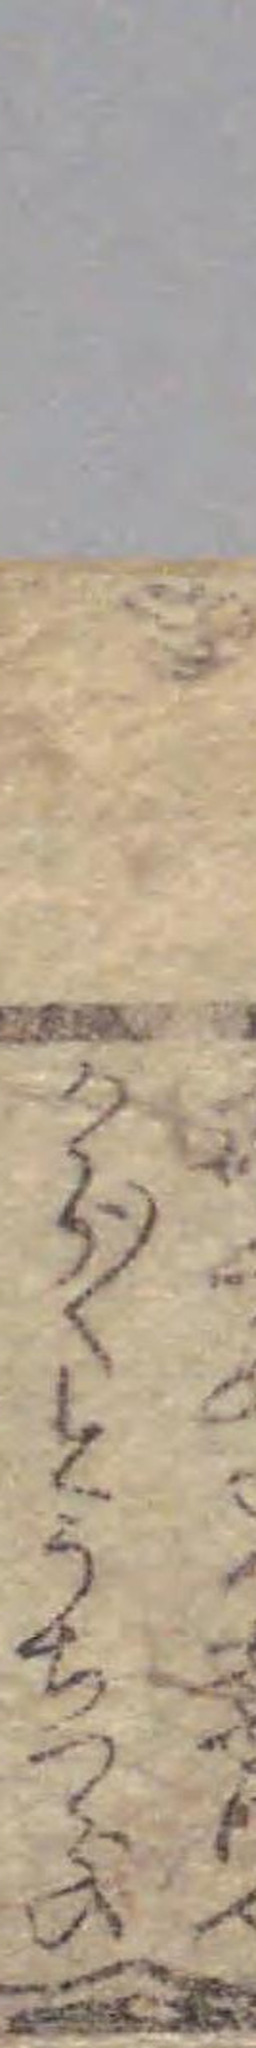から〳〵とうちわらい
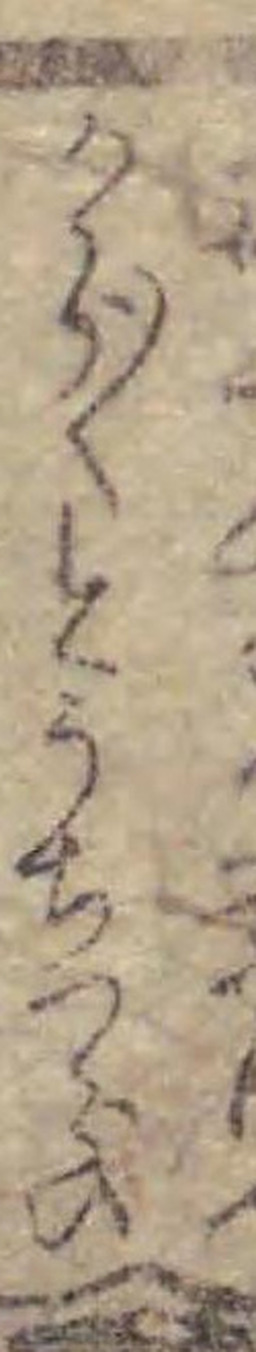から〳〵とうちわらい
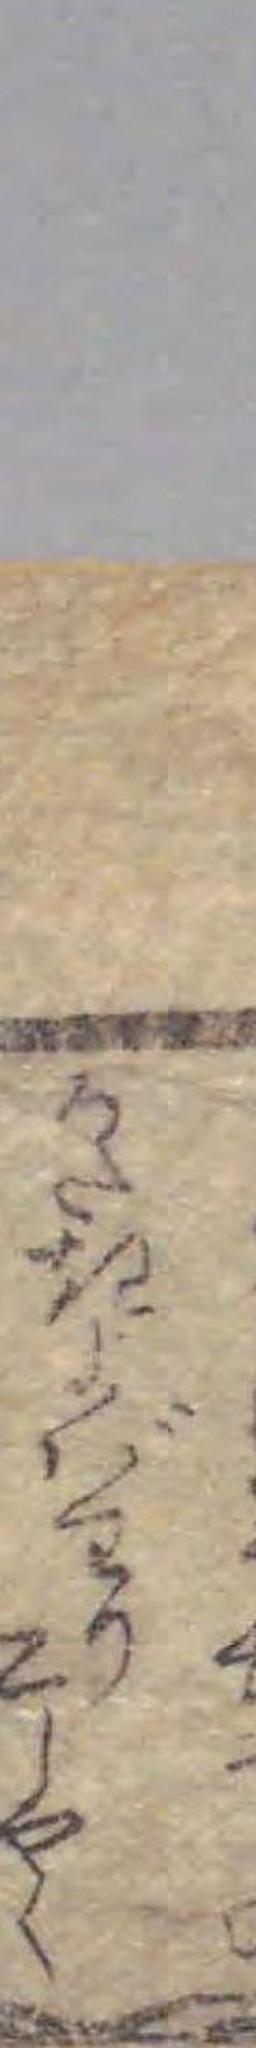かたきよばわり
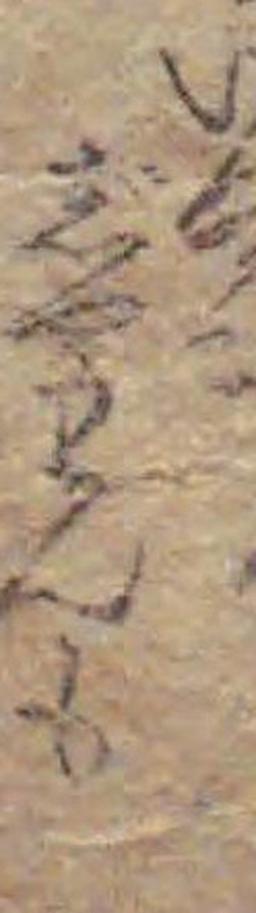じやりんも
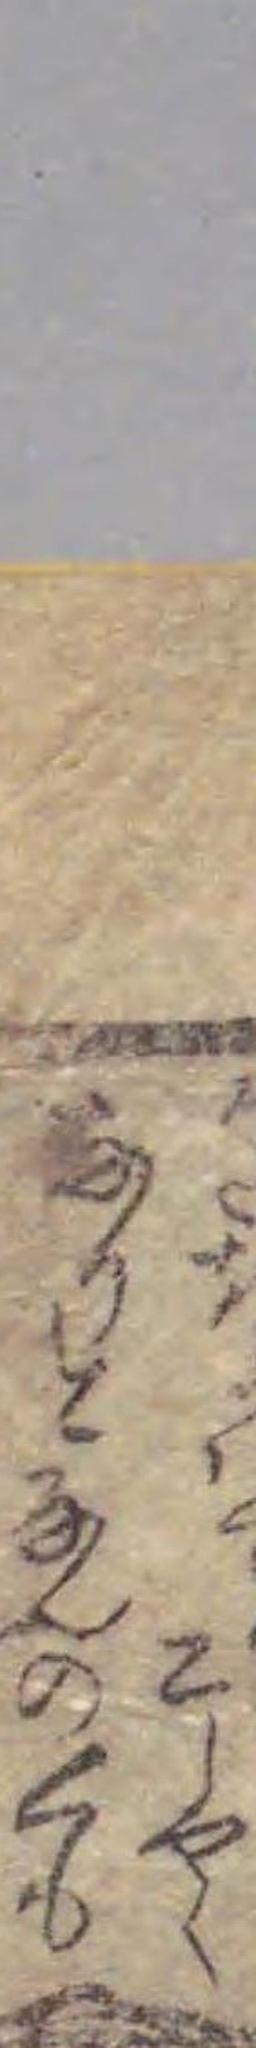なりとなんのくも
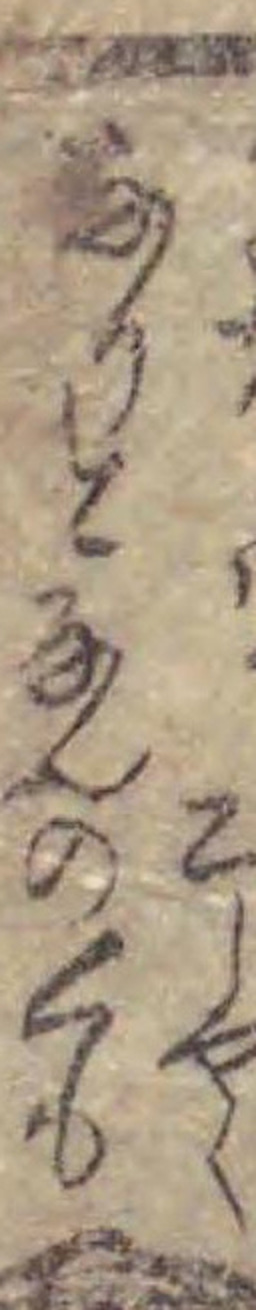なりとなんのくも
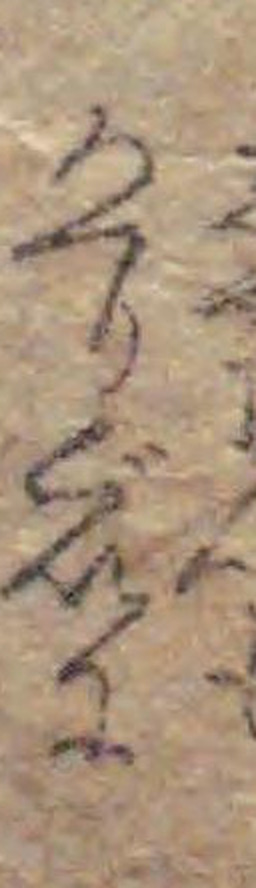かへりぐいに
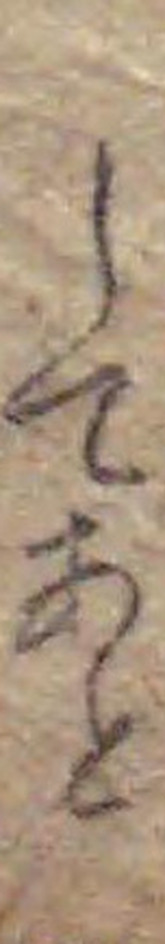してあと
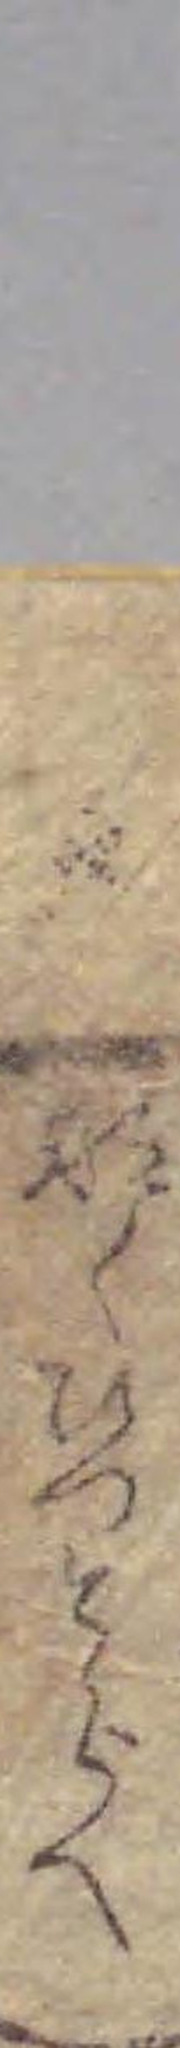なくひつとらへ
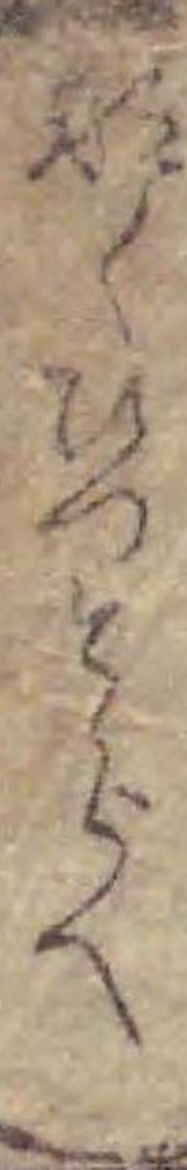なくひつとらへ
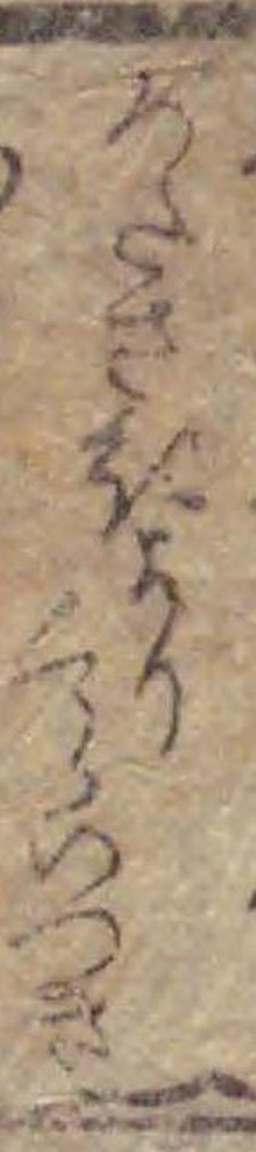かたさきより
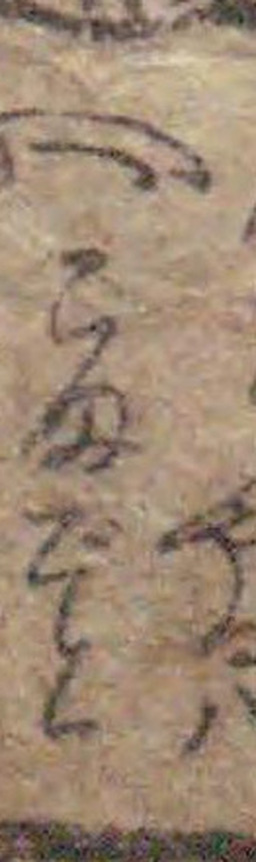こまごと
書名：化物世界夜半嵐 : 3巻
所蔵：国立国会図書館 National Diet Library, JAPAN
